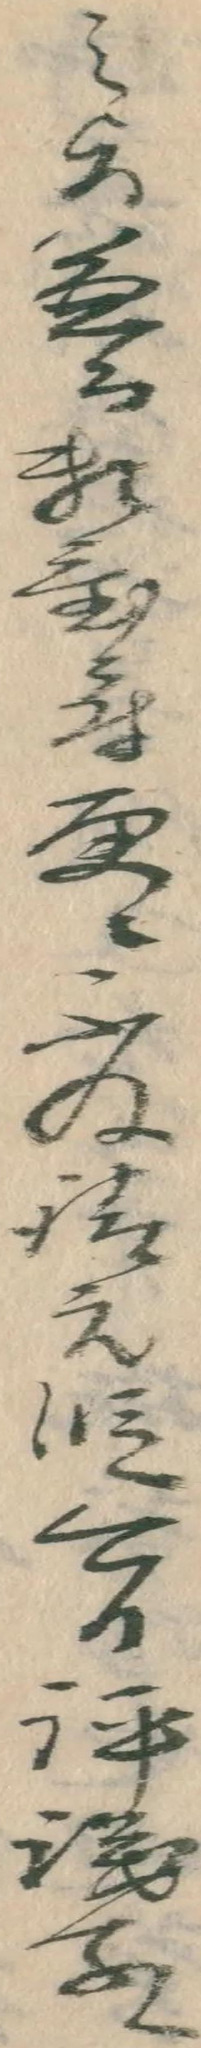之旨兼而頼置ニ付更二不及請元段今日評議致候
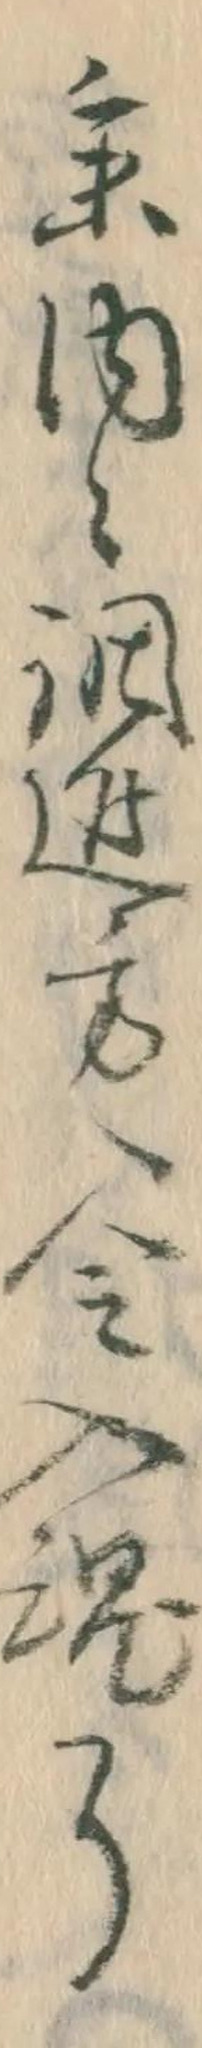参内之調進方へ令入魂了
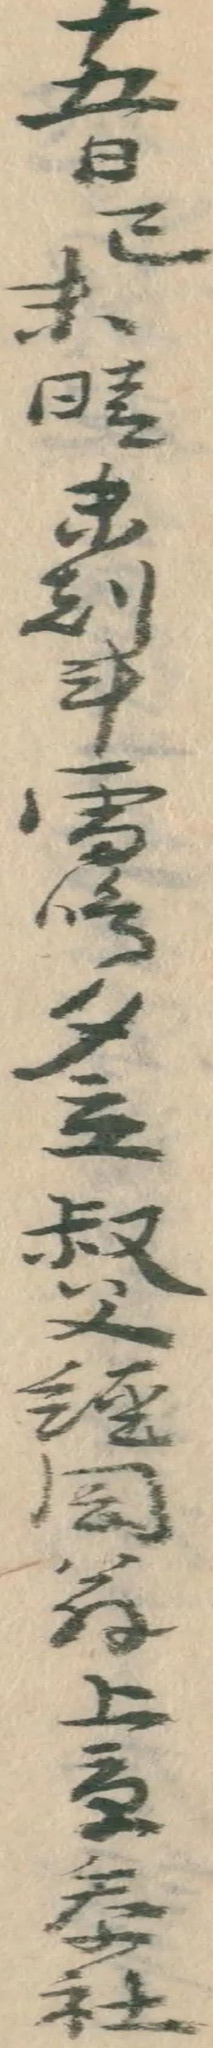十五日己未晴未刻斗雷鳴夕立叔父経同翁上京参社
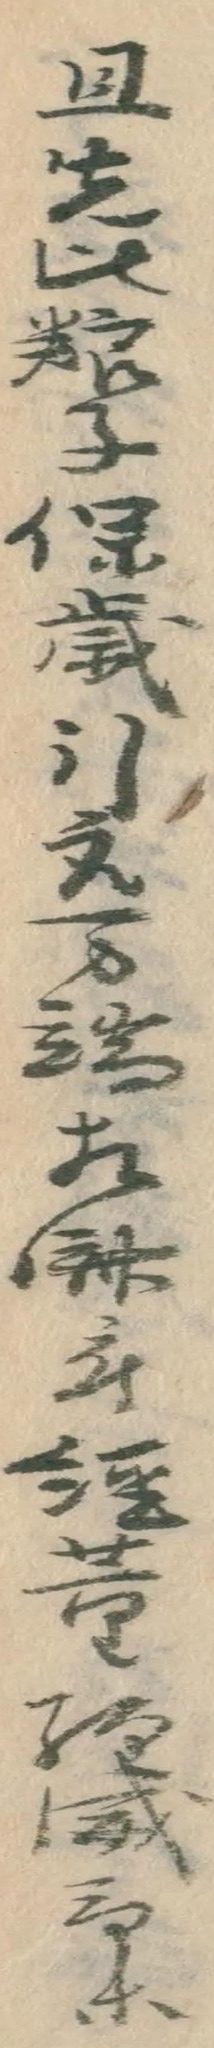且先此養子保歳引取万端相済ニ付経威予等

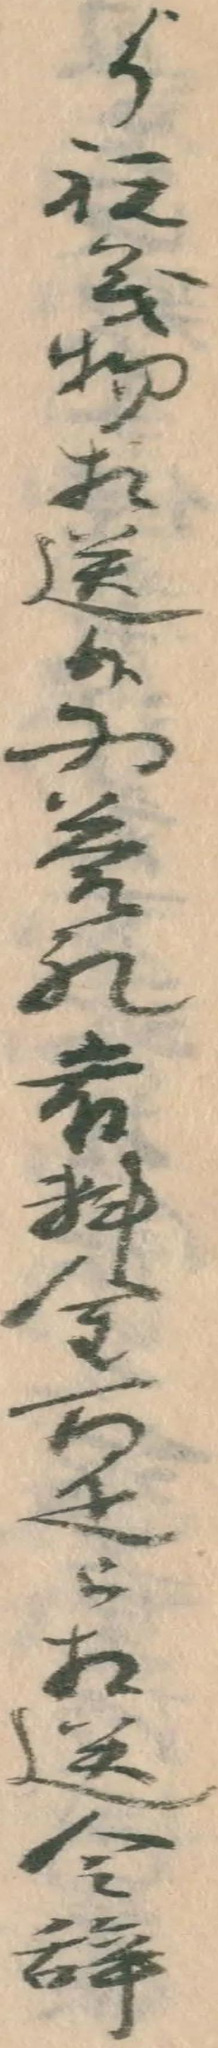より祝義物相送候為答礼肴料金百疋被相送令辞
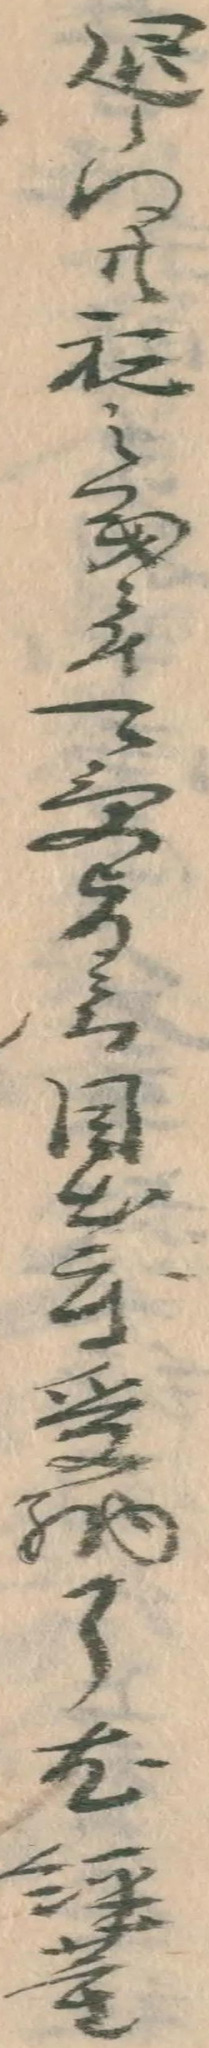退候得共祝之義に付可受旨ニ而目出度受納了尤経董
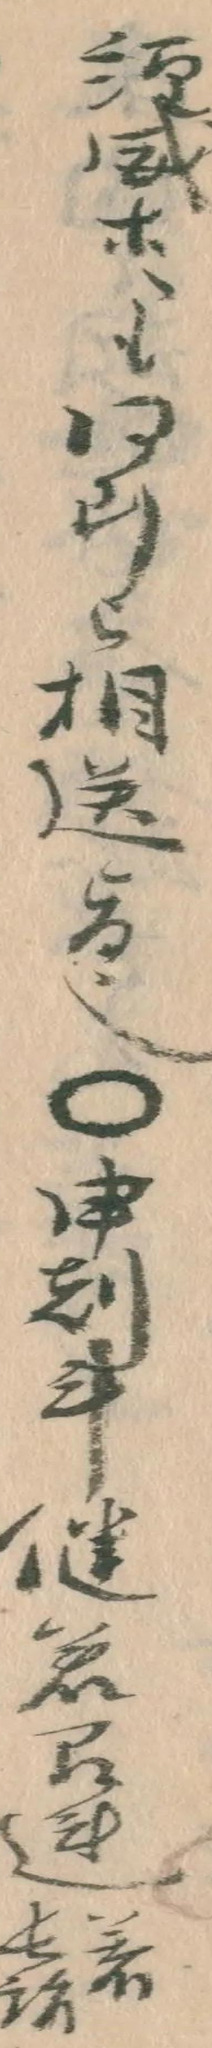経威等へも同断被相送旨也○申刻斗健若召連着長続
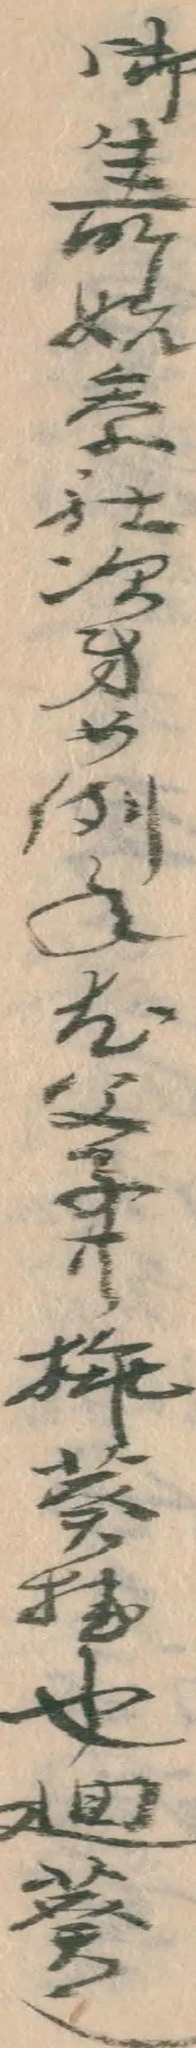御生所始参社次第如例年尤父子共挿葵持也廻葵也
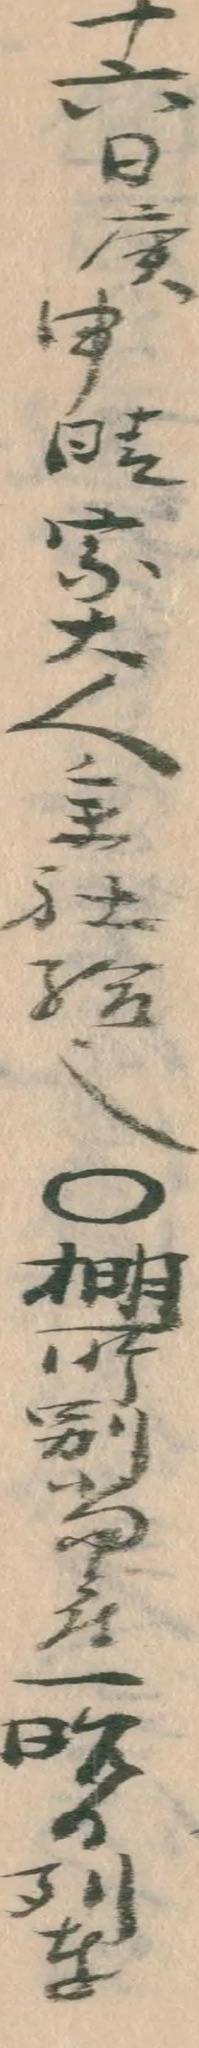十六日庚申晴家大人参社給也○棚所別當ニ付一昨日列奉
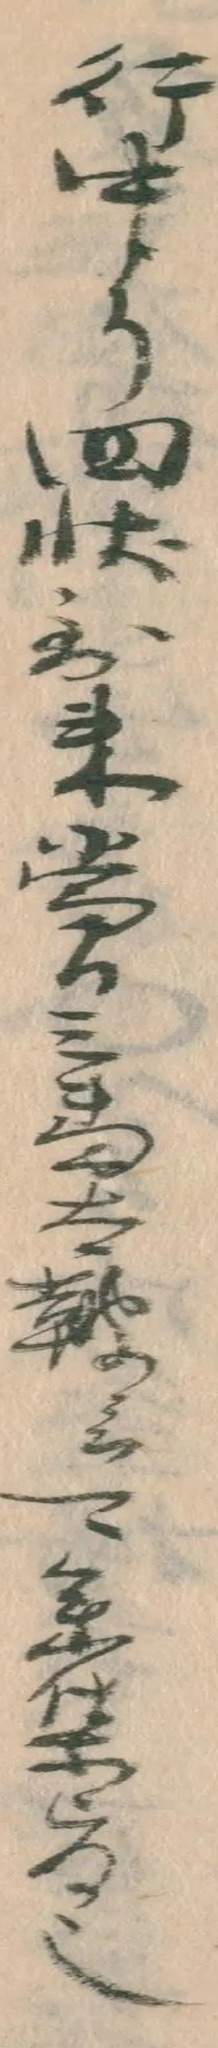行中より回状到来當日三番太鼓ニ而可参集旨也
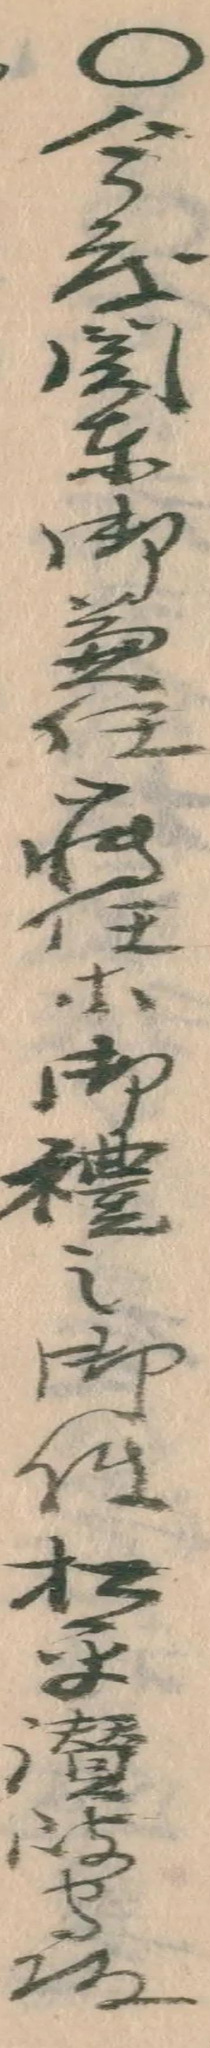○今度関東御兼任御轉任御禮之御使松平讃岐守殿
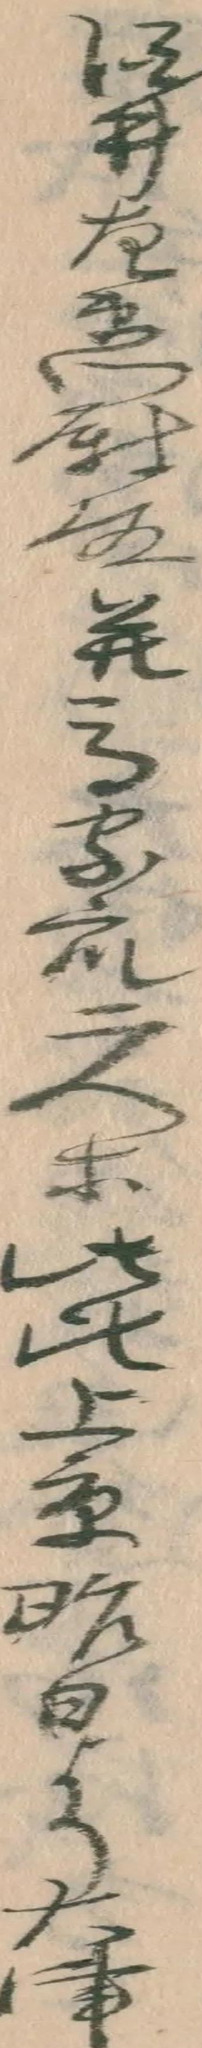酒井左衛門尉殿并高家衆二人等此比上京昨日より大津
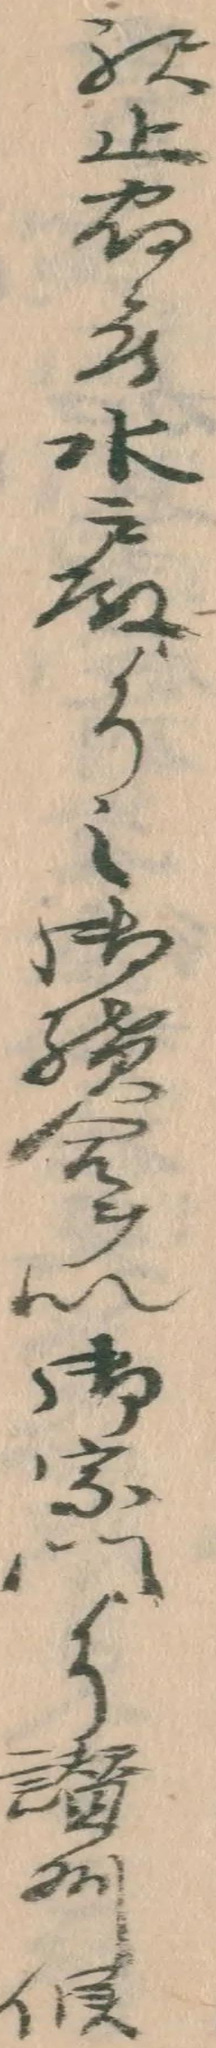駅止宿ニ付水戸殿より之御続合ヲ以御家門より讃州侯
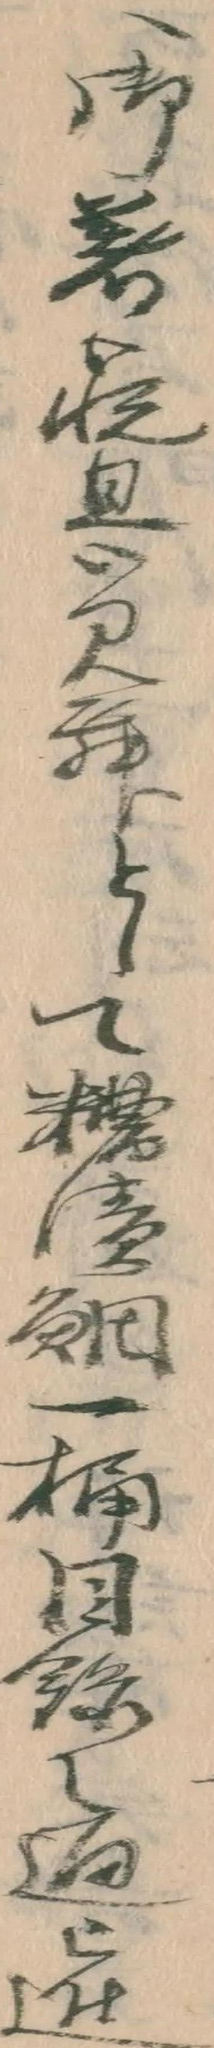へ御着御祝且御見舞として糟漬鯛一桶目録之通被進
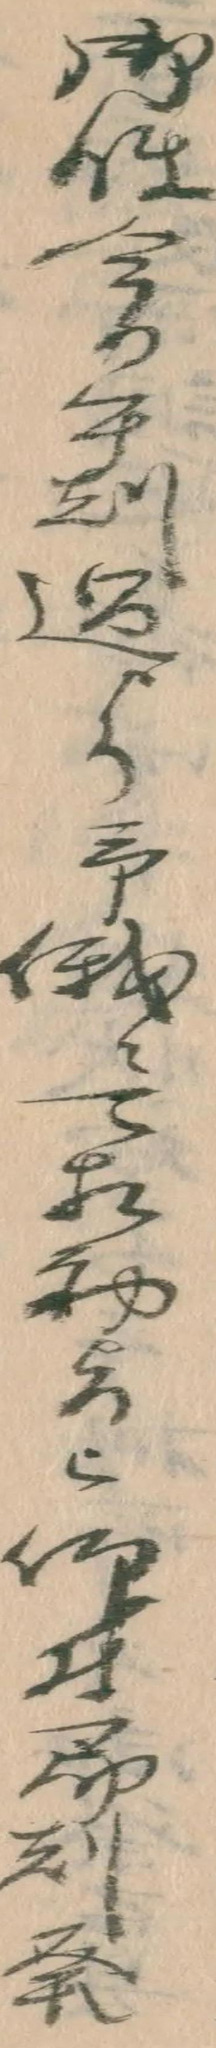御使今日午刻過より予俄ニ可相勤旨被仰付即刻発
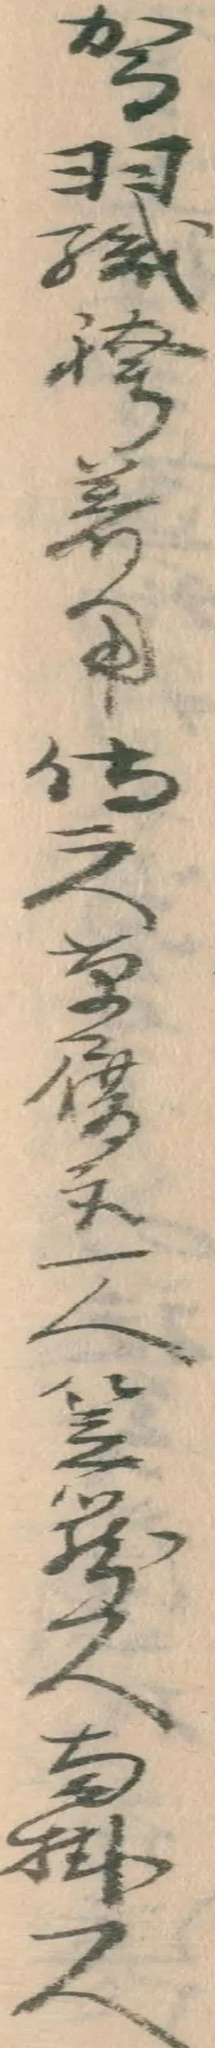駕羽織袴着用侍二人草履取一人笠籠人両掛一人
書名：賀茂社記録. 第63冊
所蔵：国立国会図書館 National Diet Library, JAPAN
